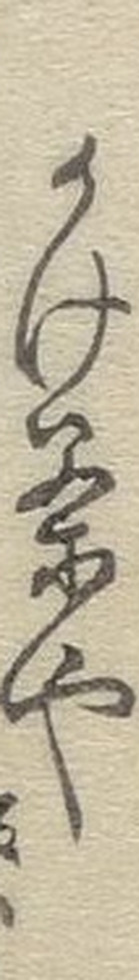かけ茶や
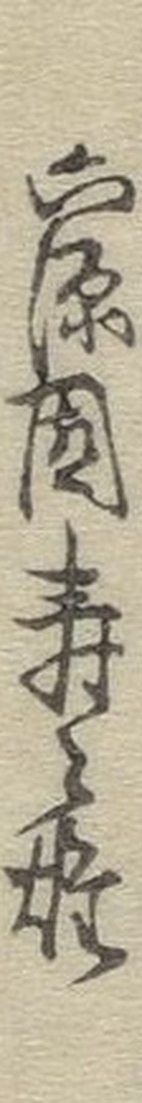六源園寿々雄

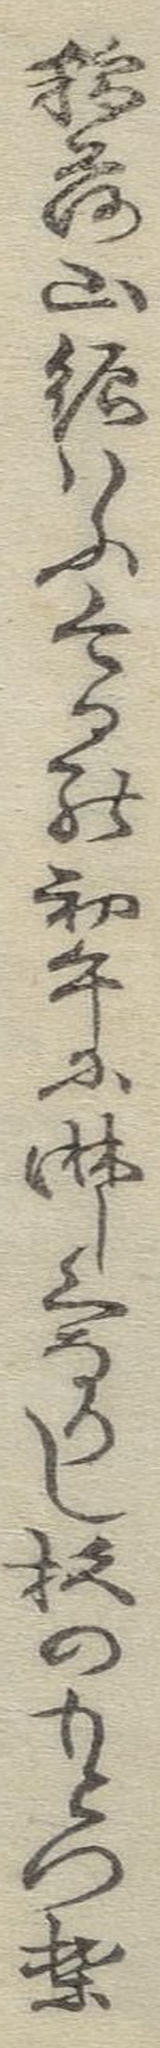稲荷山賑はふ今日の初午に淋しくなりし杉のも
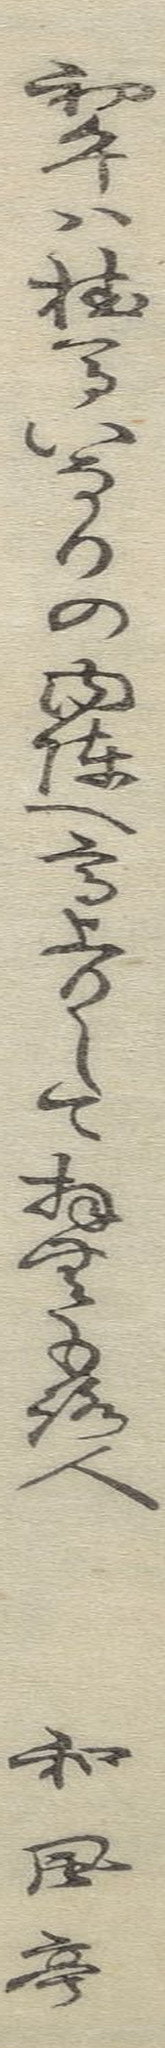初午は植馬いなりの内陣へ高上りして拝むもろ
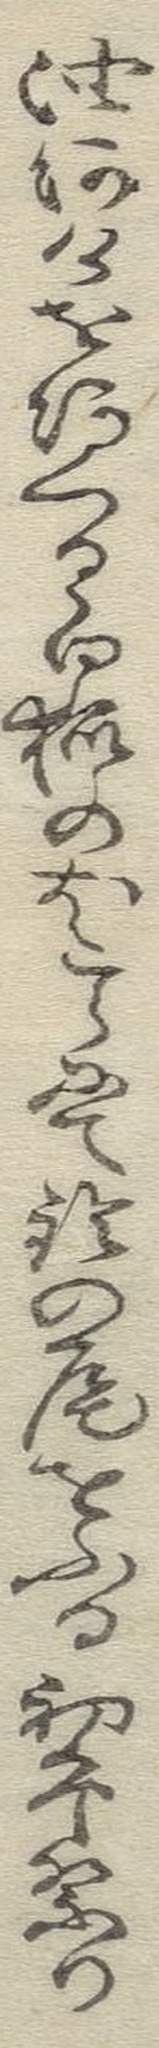油あけをあくる白狐のほこらにて鈴の尾をふる
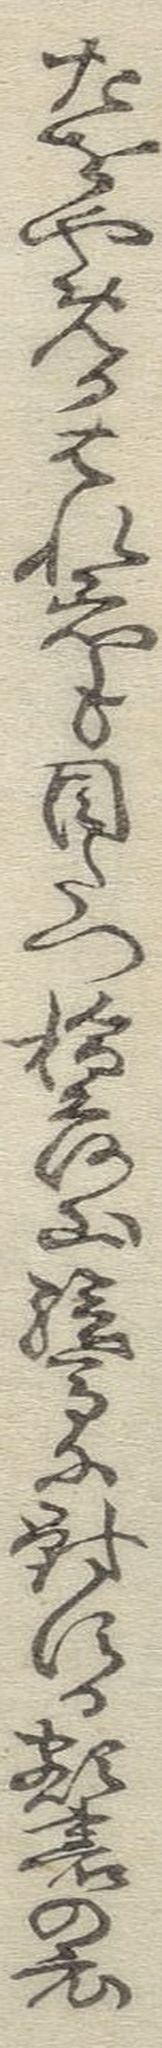たおやめかはれ着も目たつ稲荷山絵馬に対する
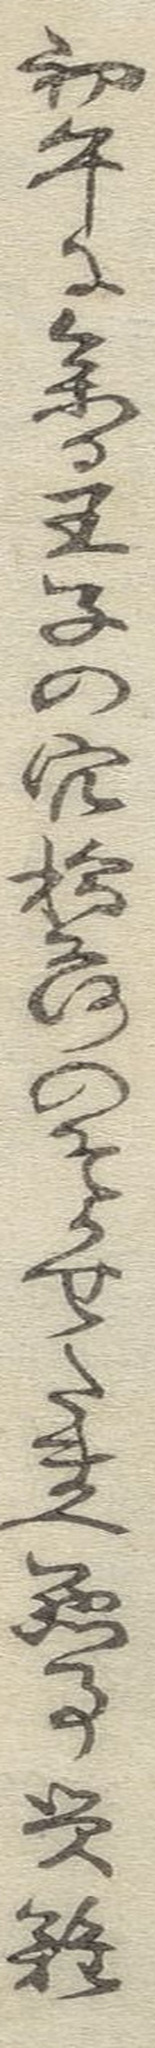初午に参る王子の穴稲荷のそかせたまへ悪事災
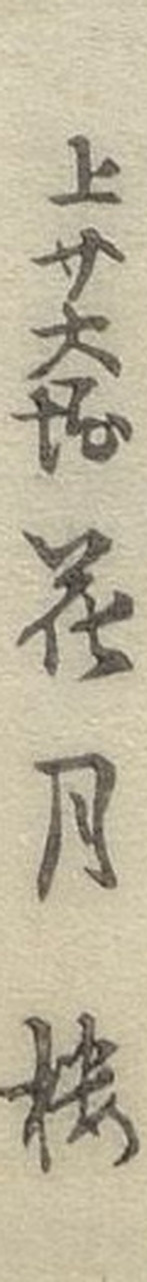難上サ大堀花月楼
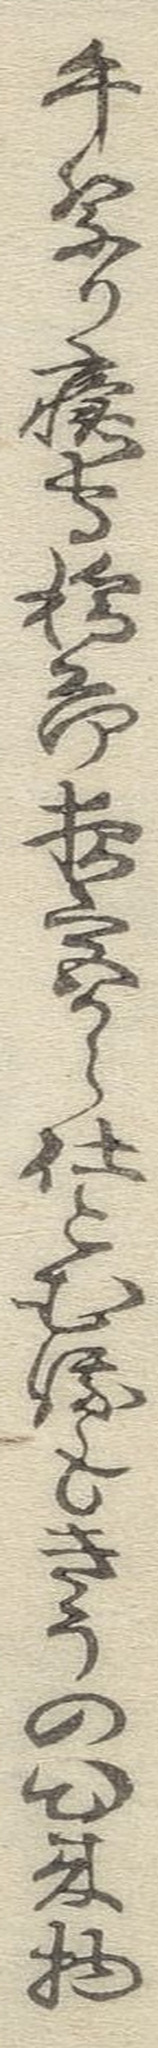午祭り瘡守稲荷夜宮から仕こむ像もきうの出来
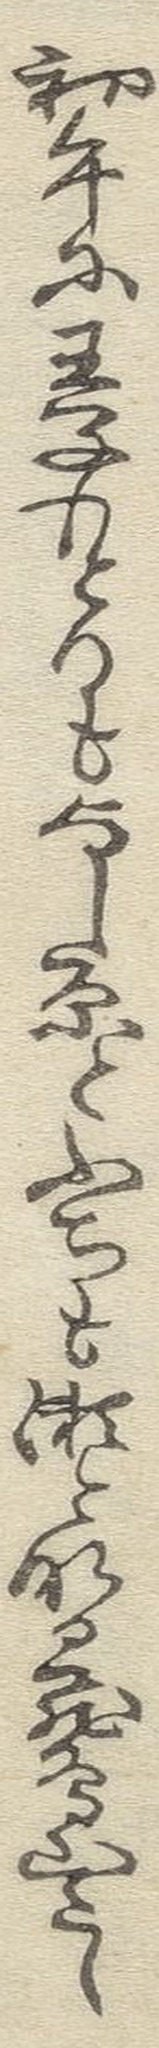初午に王子もとりもよし原とふちも瀬となる飛
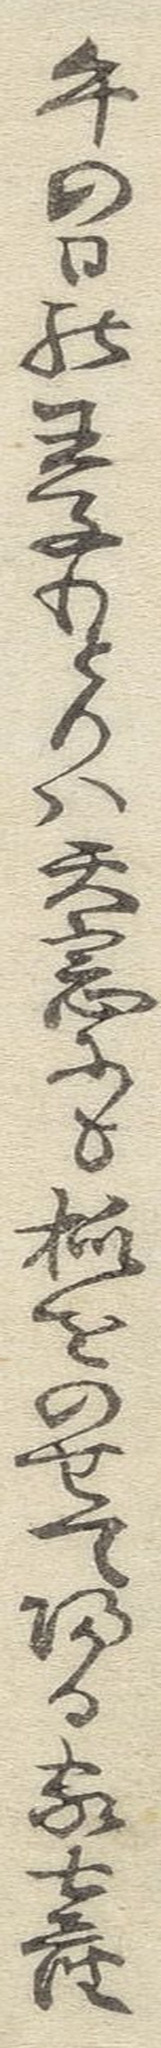午の日の王子もとりは天窓にも狐をのせて帰る
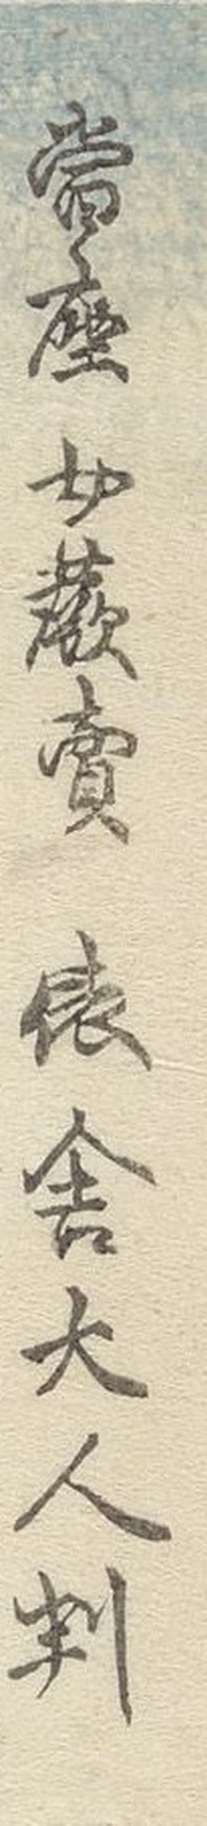当座女蕨売俵舎大人判
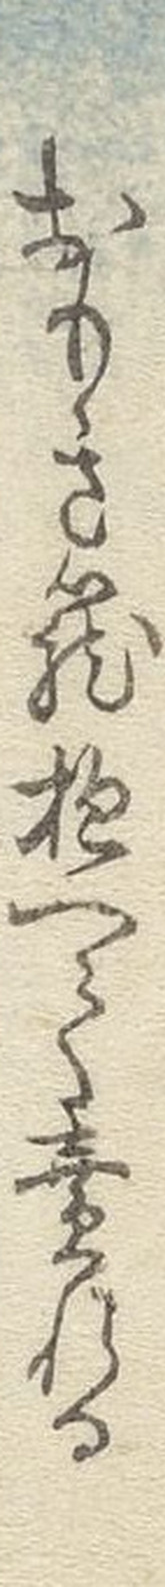おもき籠抱へて売れる
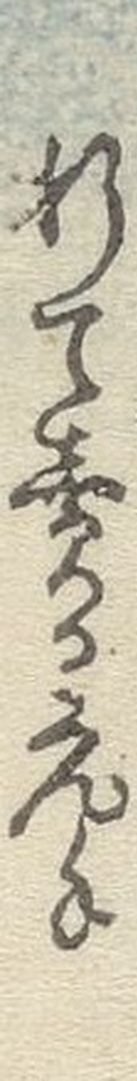折て売る元手
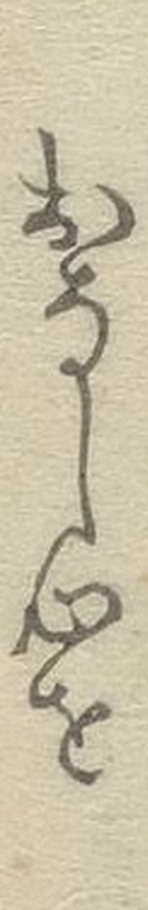おなし心を
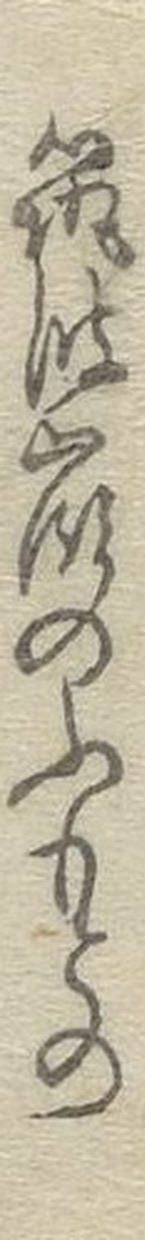筑波嶺のふもとの
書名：Picture Album of People with Kyōka (Light Verse) (Kyōka shiki jinbutsu 狂歌四季人物)
